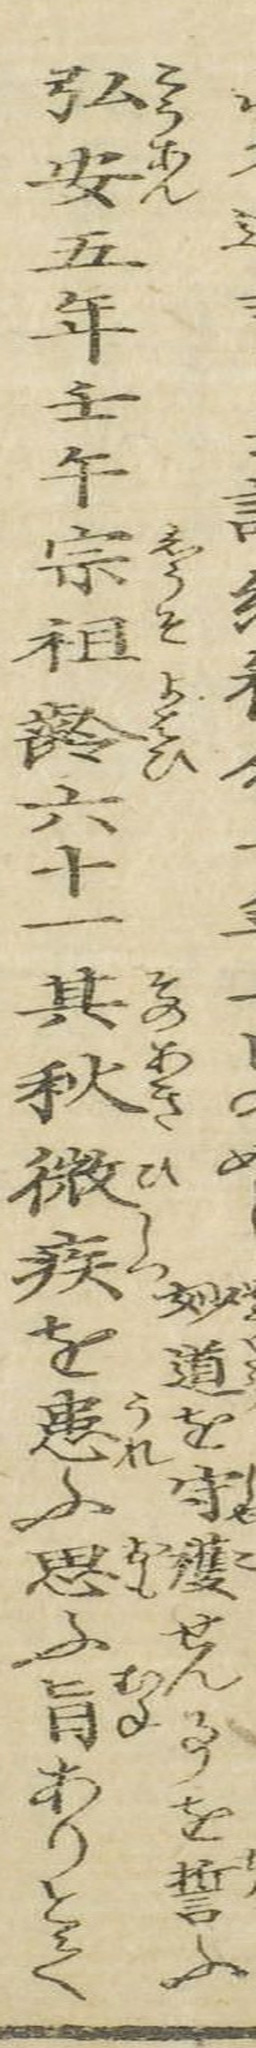弘安五年壬午宗祖齢六十一其秋微疾を患ふ思ふ旨ありとて
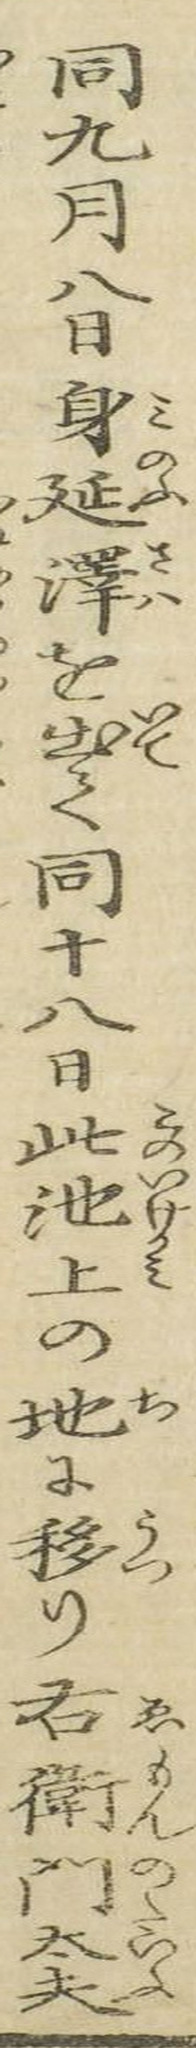同九月八日身延澤を出て同十八日此池上の地に移り右衛門太夫
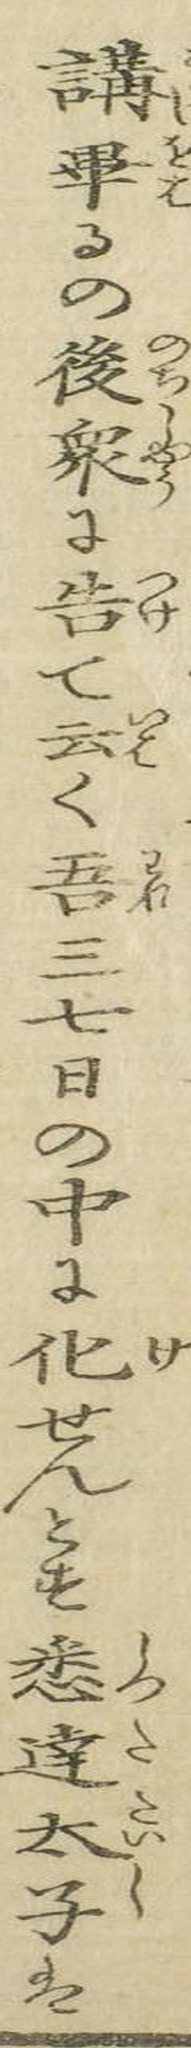講畢るの後衆に告て云く吾三七日の中に化せんとす悉達太子は
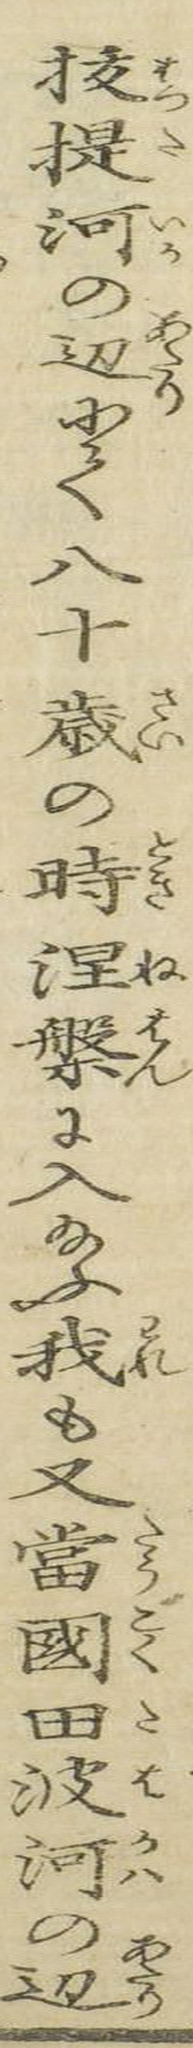抜提河の辺にて八十歳の時涅槃に入給ふ我も又當國田波河の辺
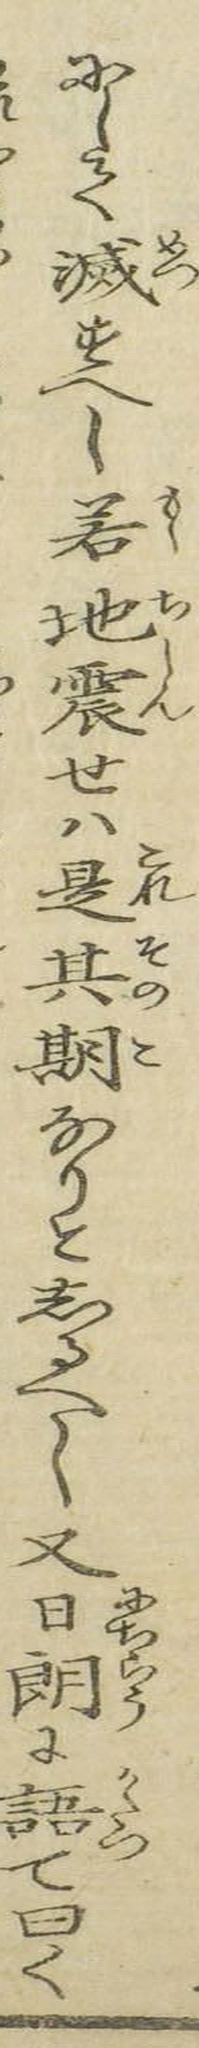にして滅すへし若地震せは是其期なりとしるへし又日朗に語て曰く
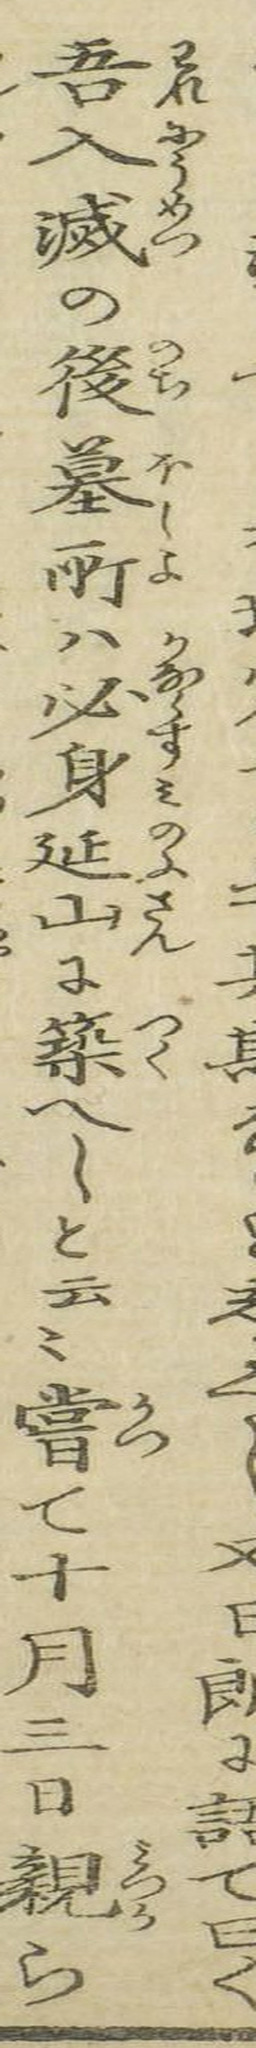吾入滅の後墓所は必身延山に築へしと云々嘗て十月三日親ら
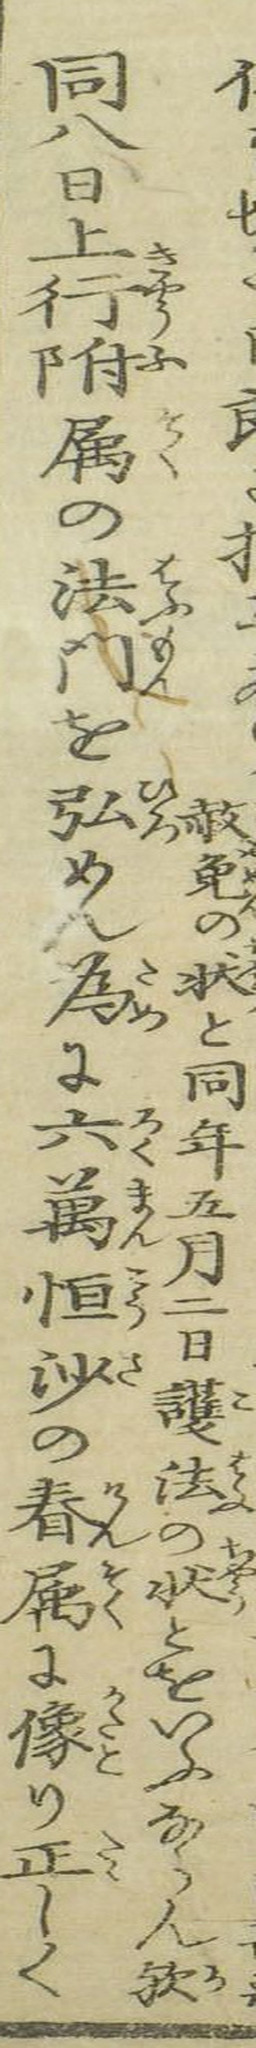同八日上行附属の法門を弘めん為に六萬恒沙の眷属に像り正しく

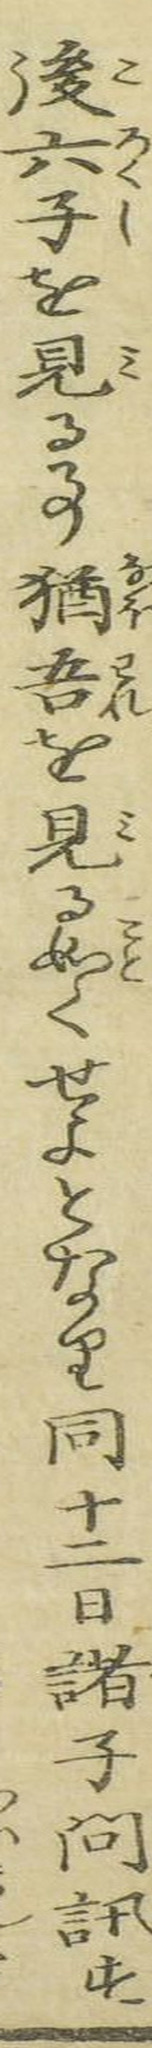後六子を見る事猶吾を見る如くせよとなり同十二日諸子問訊す
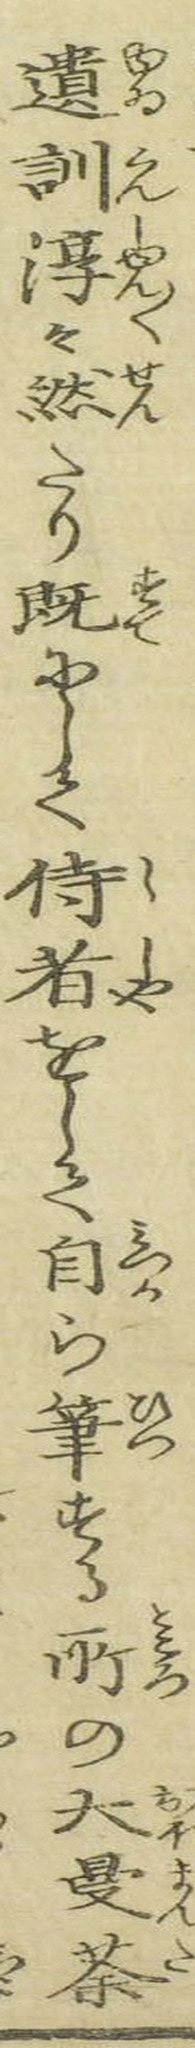遺訓淳々然たり既にして侍者をして自ら筆する所の大曼荼
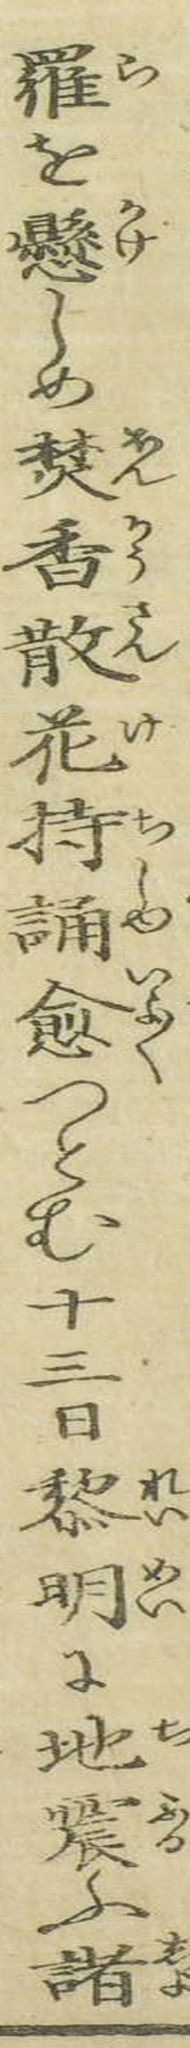羅を懸しめ焚香散花持誦愈つとむ十三日黎明に地震ふ諸
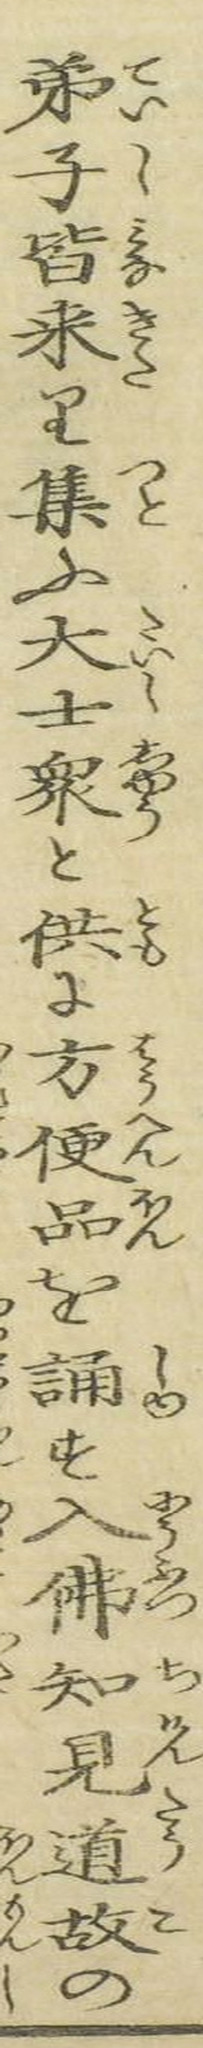弟子皆来り集ふ大士衆と伴に方便品を誦す入佛知見道故の
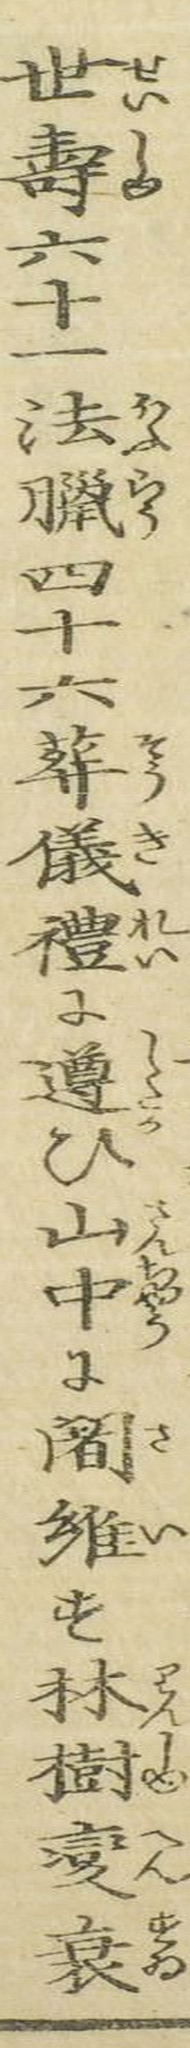世壽六十一法臘四十六葬儀禮に遵ひ山中に闍維す林樹變衰
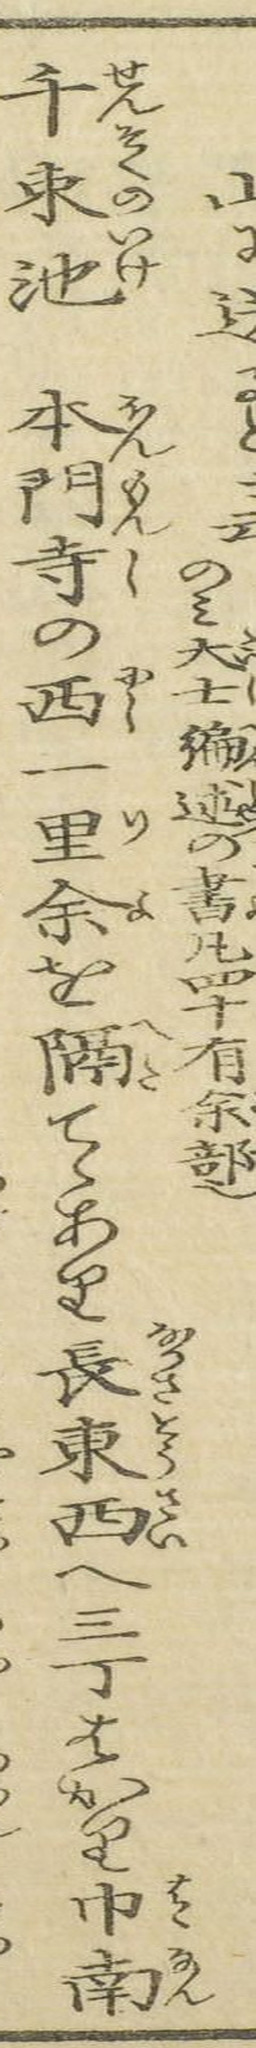千束池本門寺の西一里余を隔てゝあり長東西へ三丁はかり巾南
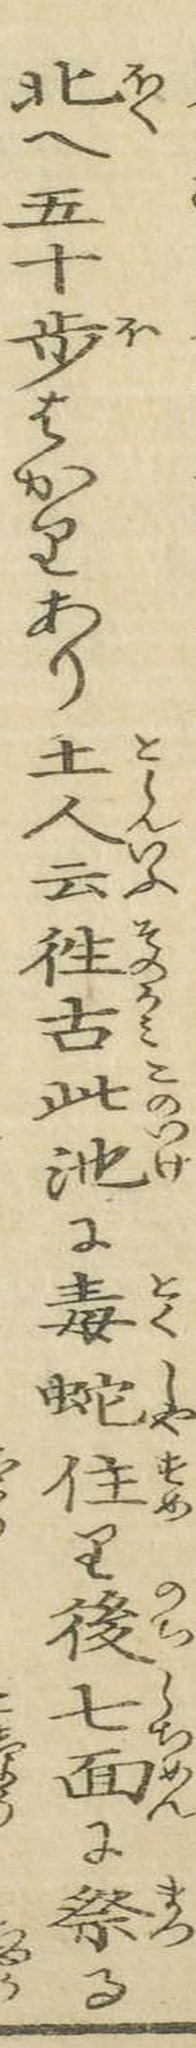北へ五十歩はかりあり土人云往古此池に毒蛇住り後七面に祭る
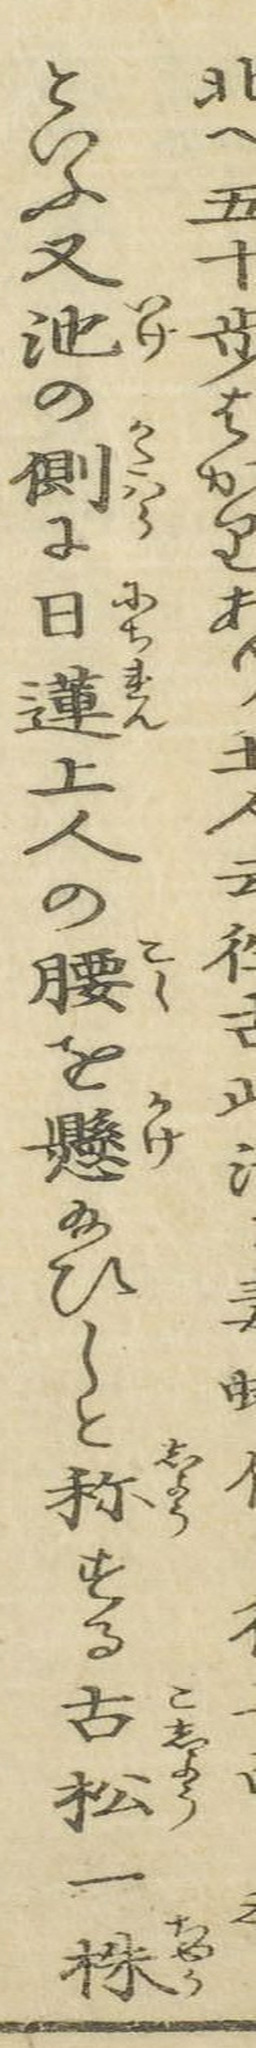といふ又池の側に日蓮上人の腰を懸給ひしと称する古松一株
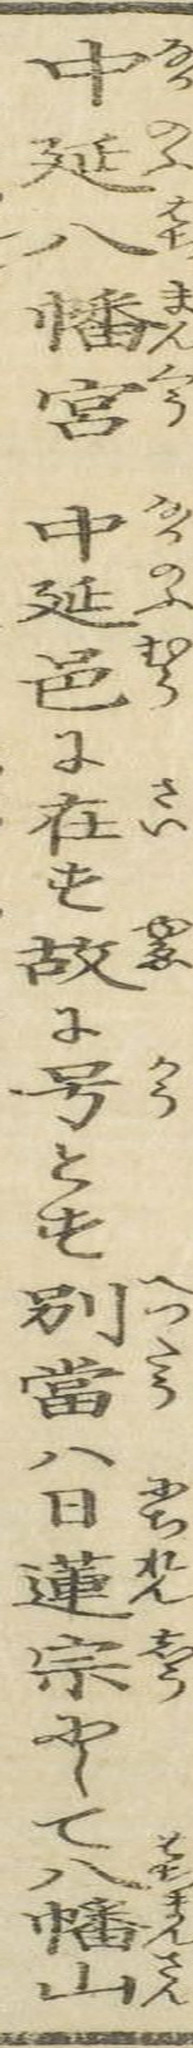中延八幡宮中延邑に在す故に号とす別當は日蓮宗にして八幡山
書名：江戸名所図会 20巻 巻之4
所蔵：東京学芸大学教育コンテンツアーカイブ
